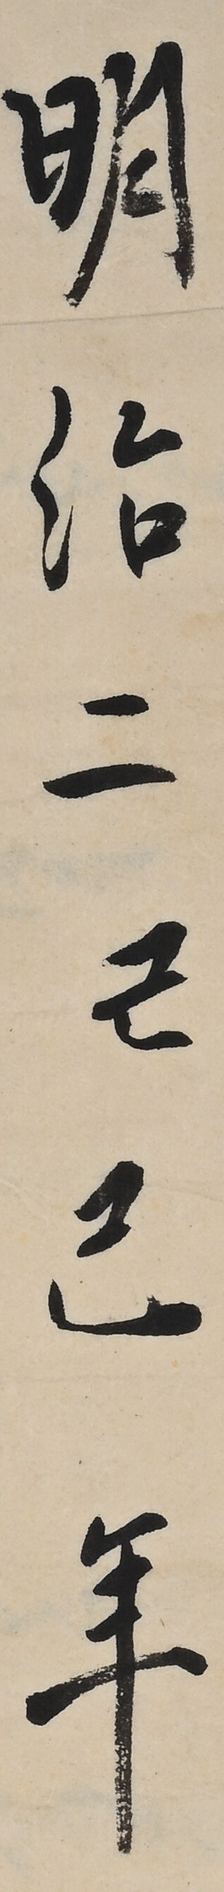明治二己巳年
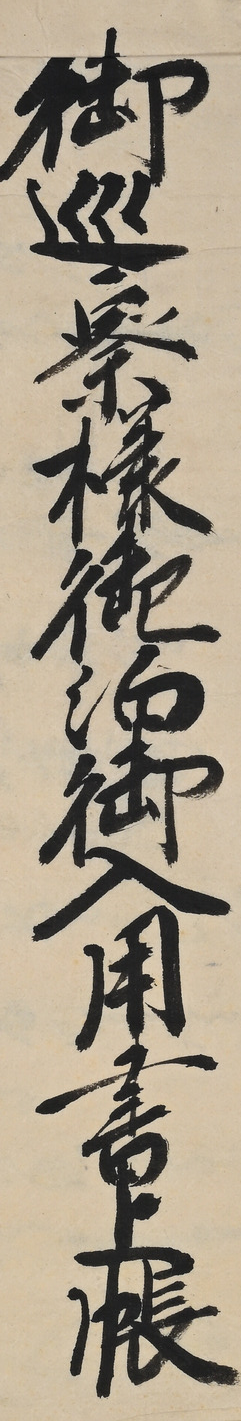御巡察様御泊御入用書上帳
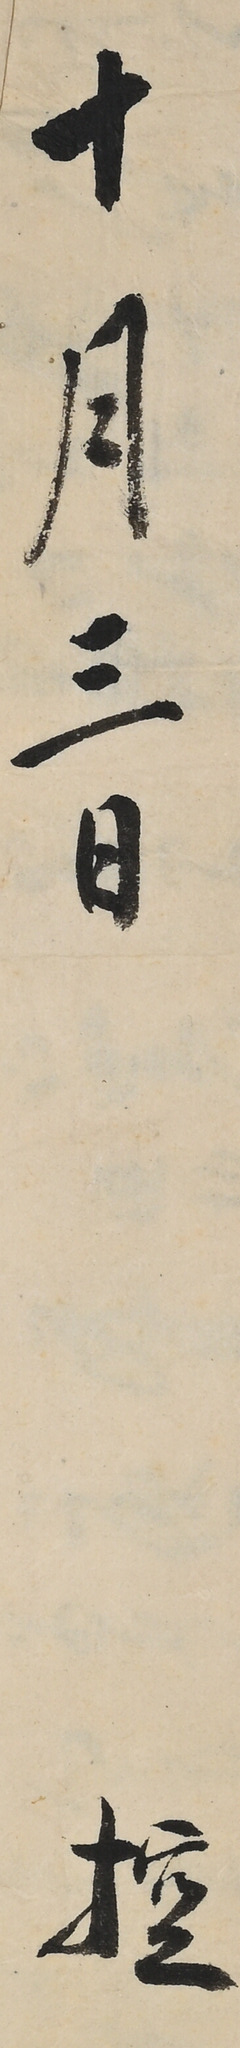十月三日控

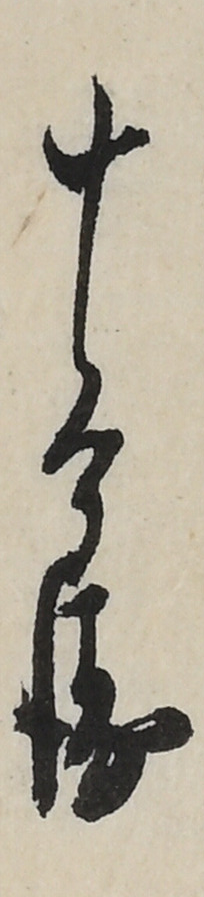十兵衛
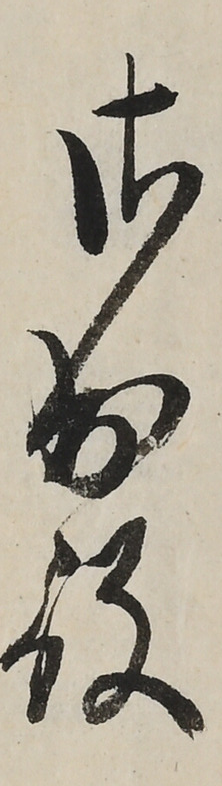御出役
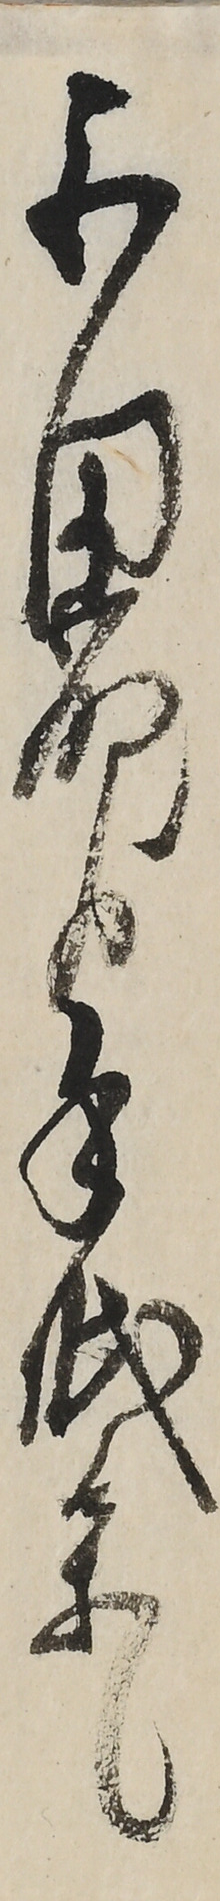宮田筋ゟ手紙参候
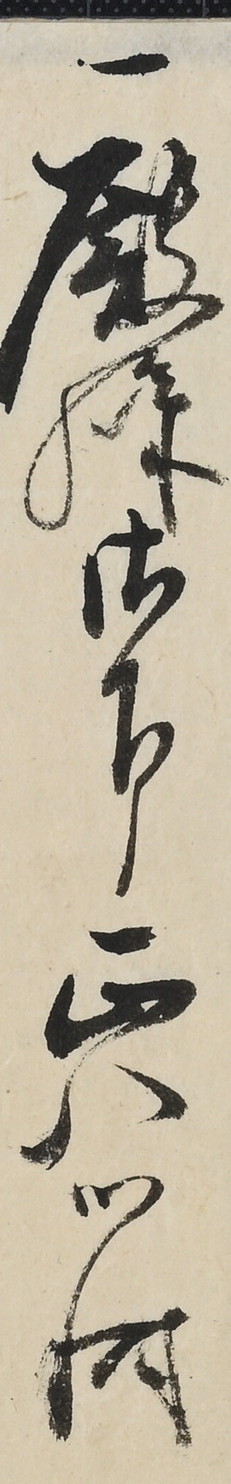一殿様御下り正八ツ時
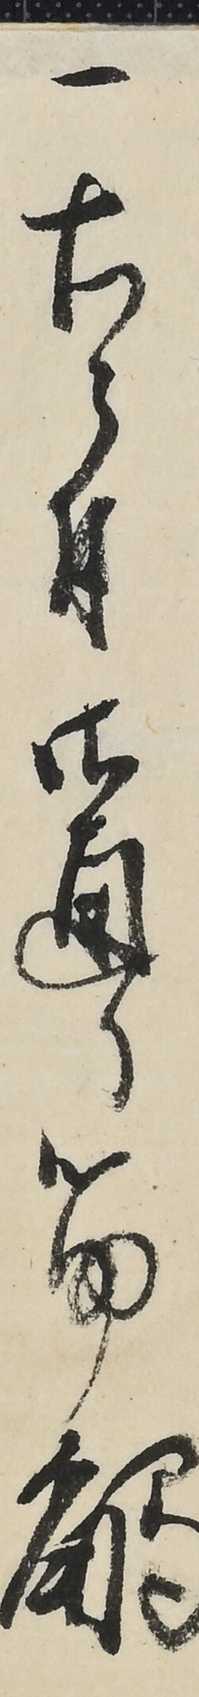一右ニ付御通り筋触

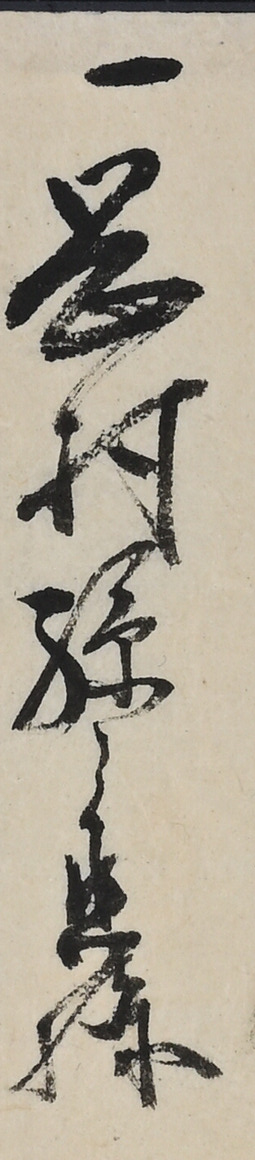一岡村孫兵衛様
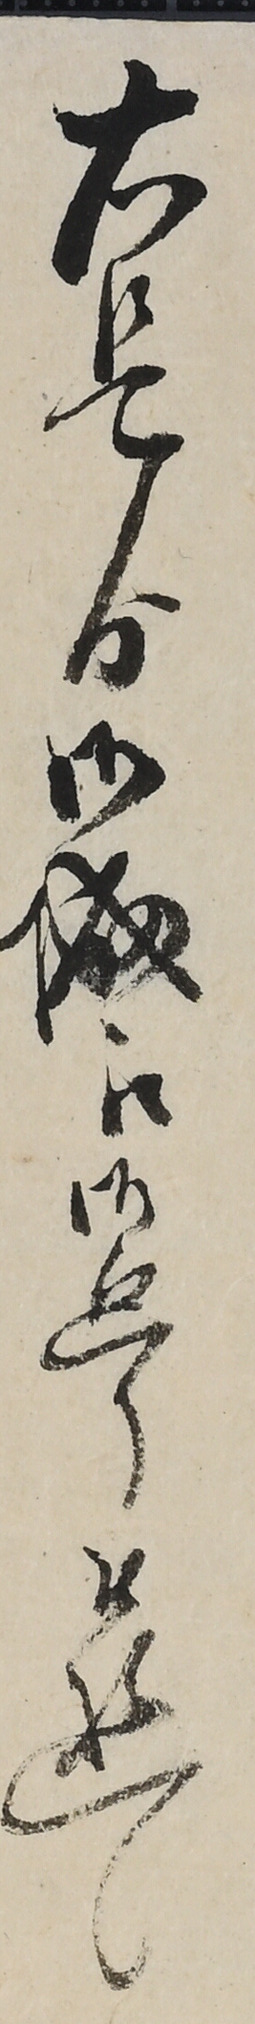右是ゟ御城江御廻り被遊候
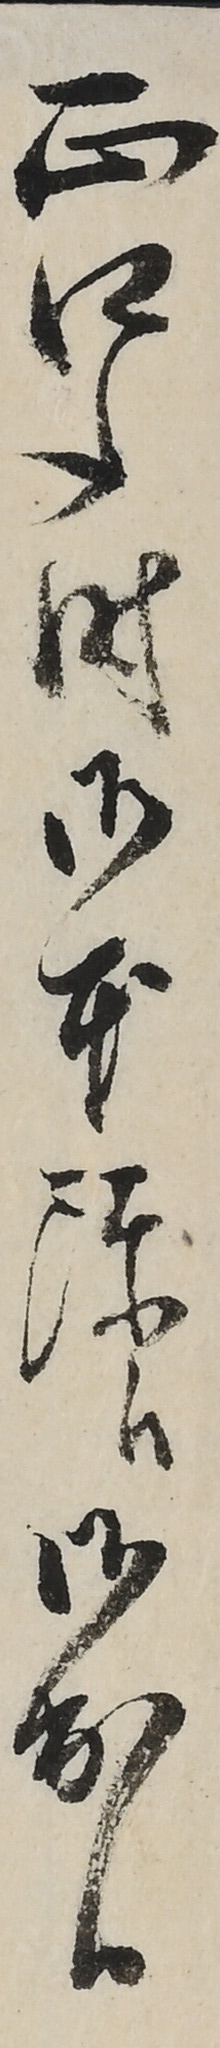正四ツ時御本陣江御出候
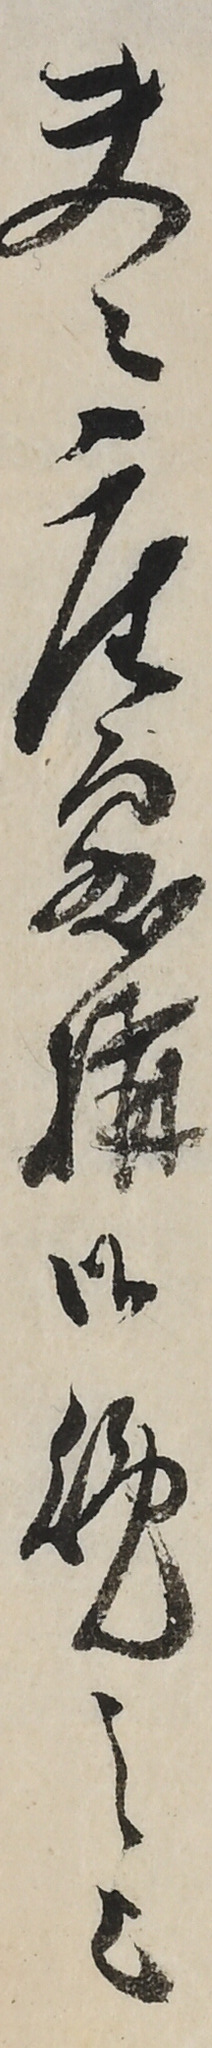夫ゝ座敷構御覧之上
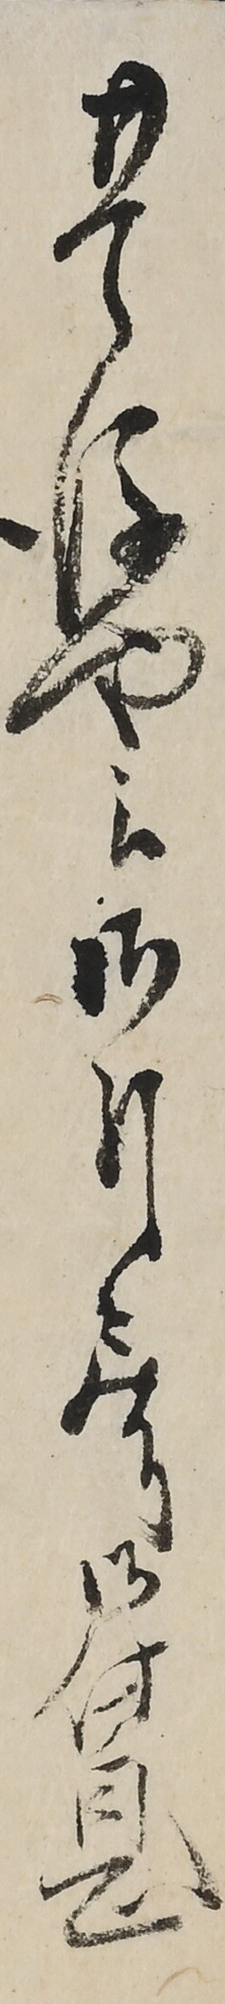豊後や江御引戻り御休息
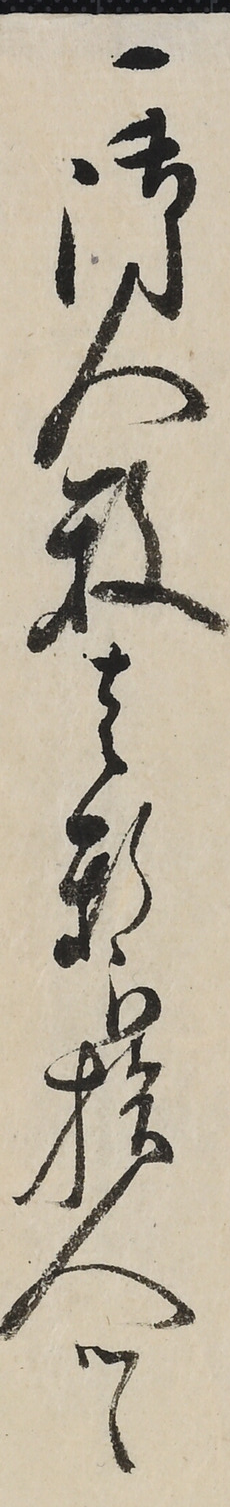一御人数壱軒江拾人ツヽ
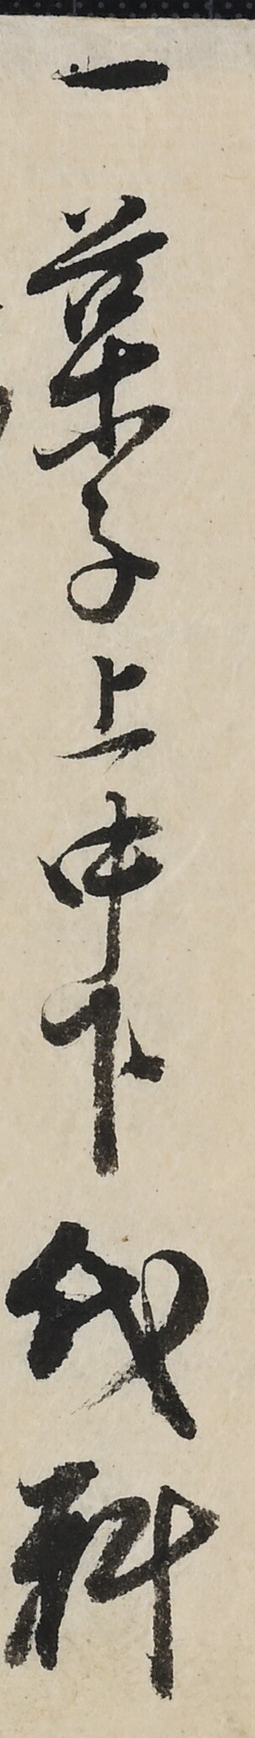一菓子上中下代科
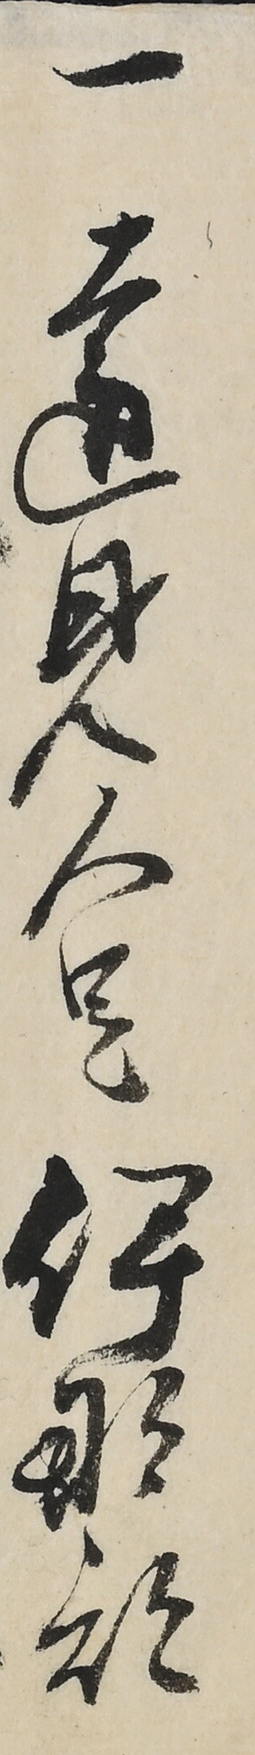一遠見人足伊那部
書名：御巡察様御泊御入用書上帳
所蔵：伊那市立高遠町図書館・合同会社AMANE
